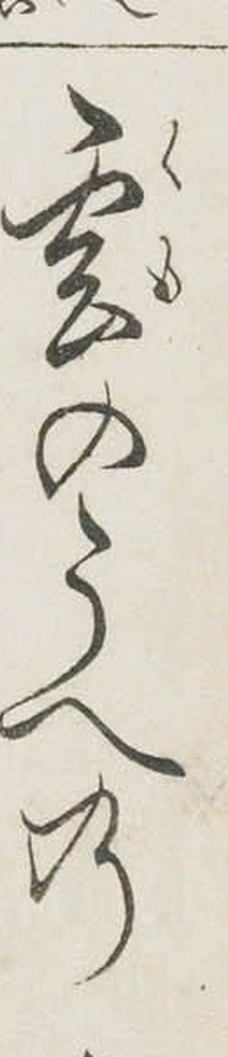雲のうへの
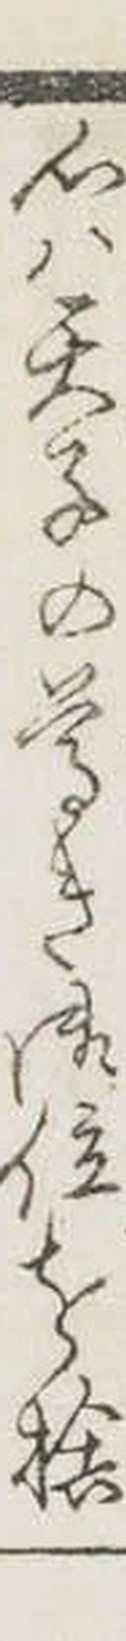心は天子の尊き御位を捨
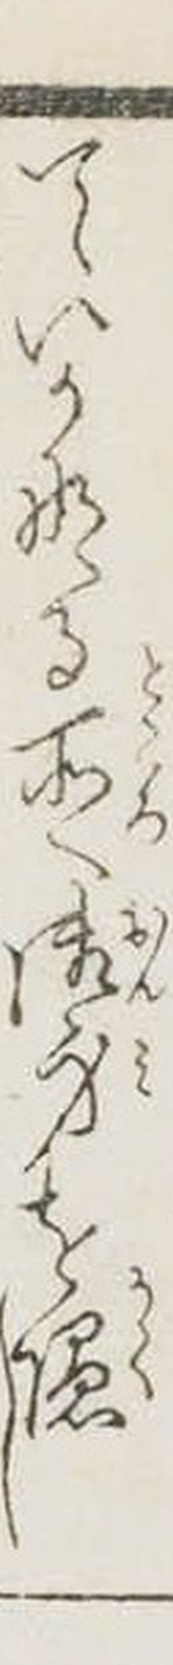ていかなる所へ御身を隠し
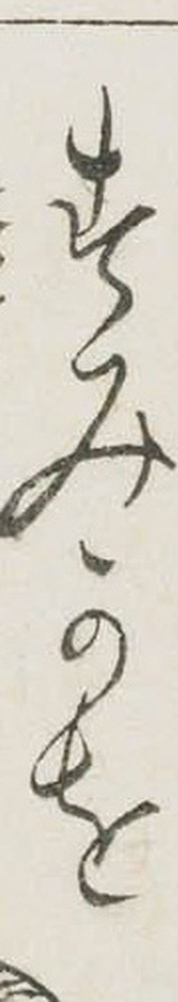すみかを
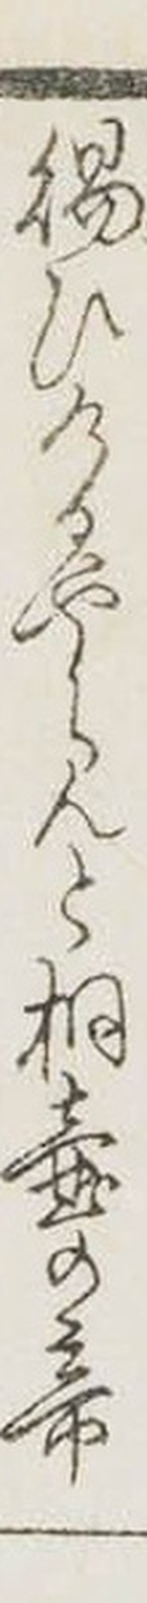賜ひけるやらんと桐壺の帝
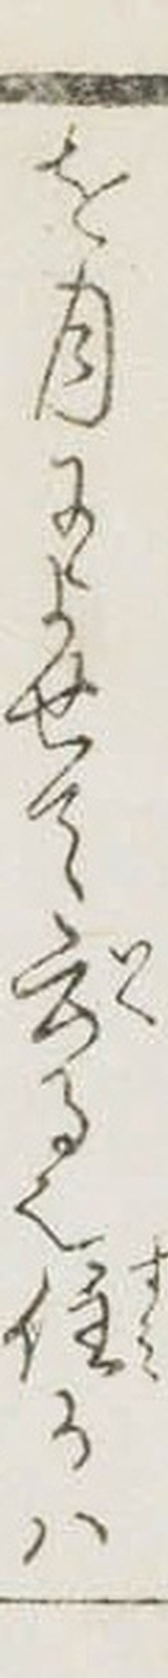を月によせて云る也住かは
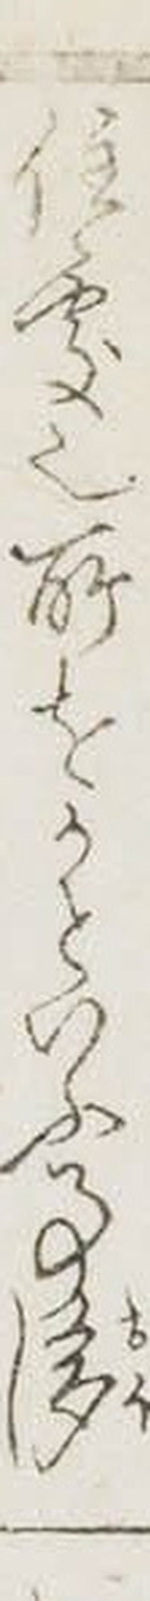住処也所をかといふ事多し
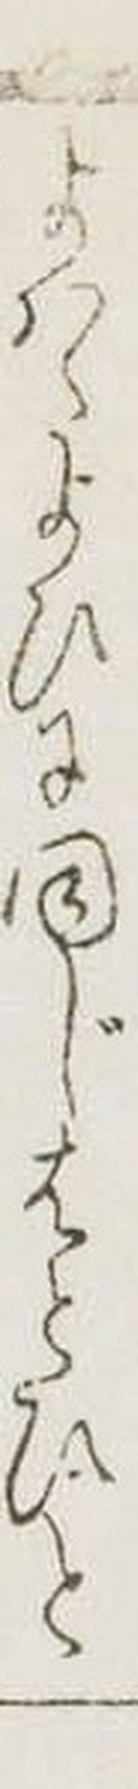よはゝよひに同じはとひと
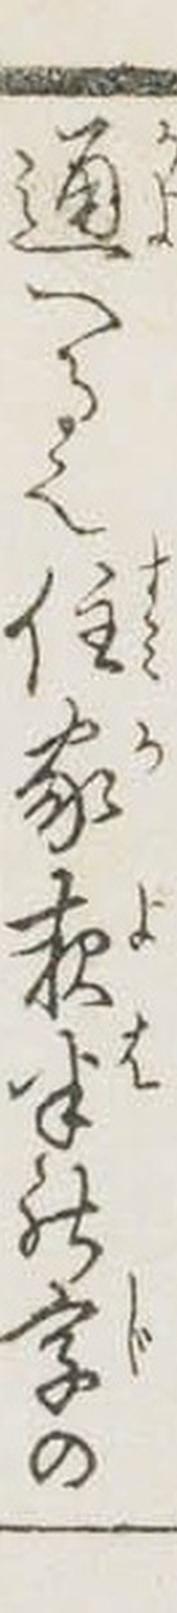通へる也住家夜半の字の
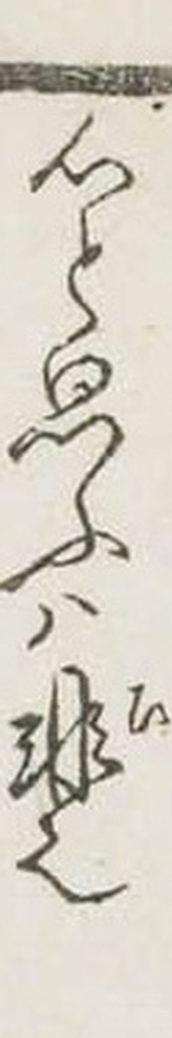心と思ふは非也
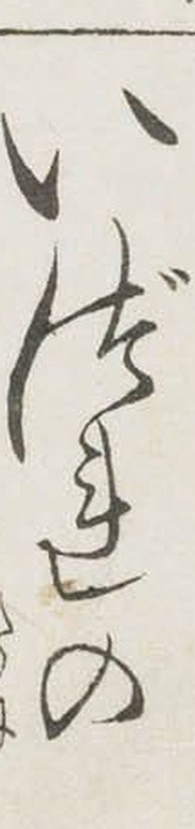いづれの
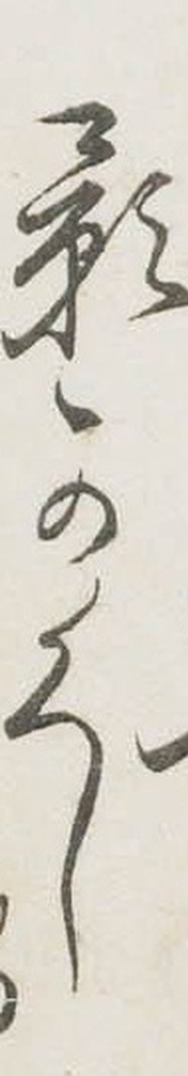影かくし
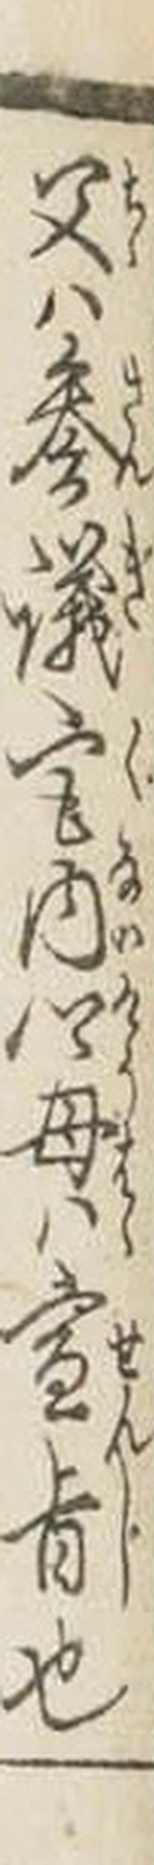父は参議宮内卿母は宣旨也
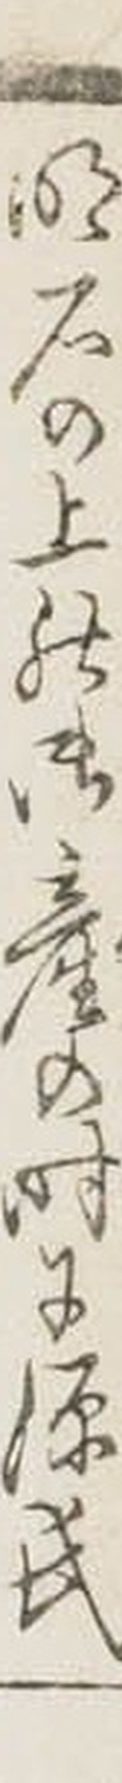明石の上の御産の時に源氏
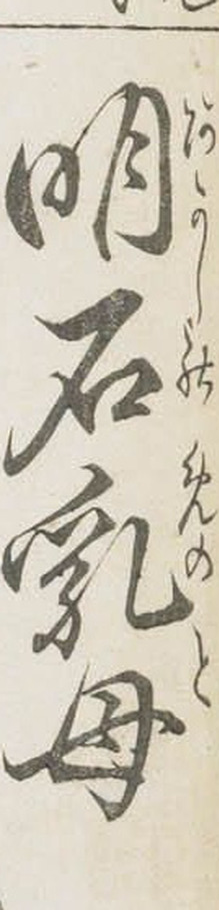明石乳母
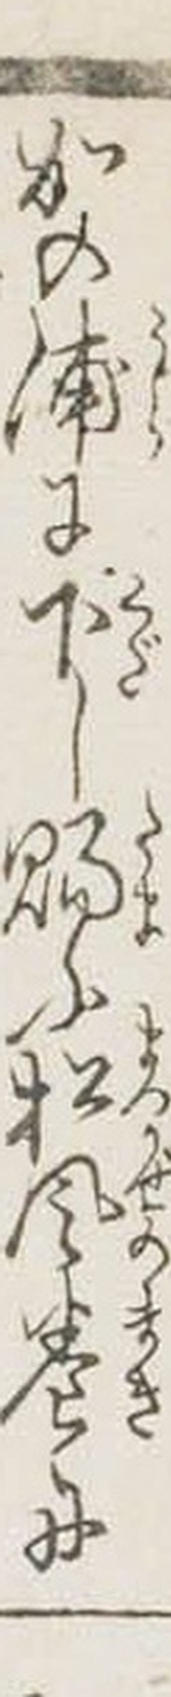かの浦に下し賜ふ松風巻に
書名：源氏百人一首
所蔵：東京学芸大学教育コンテンツアーカイブ
